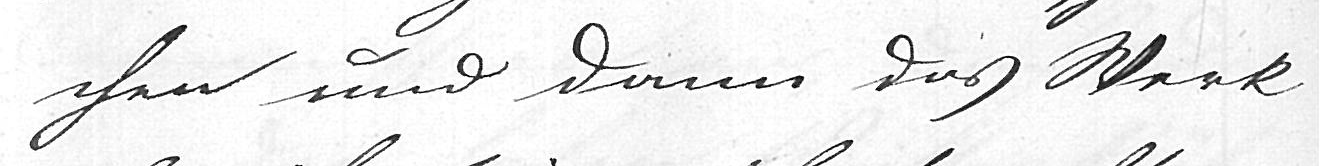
chen und dann das Werk
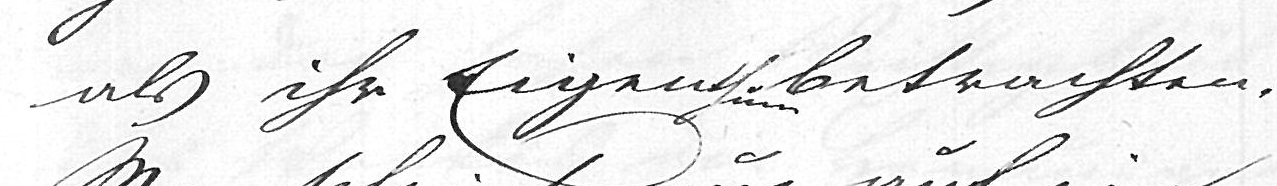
als ihr Eigenthum betrachten.
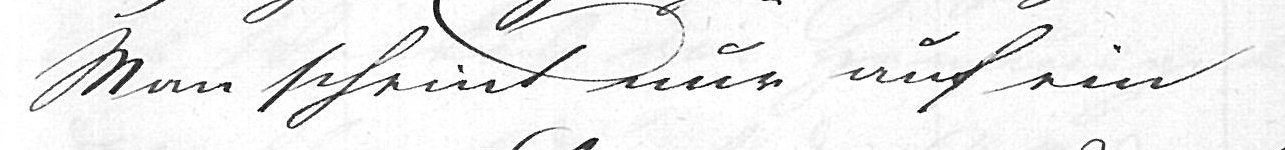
Man scheint nur auf ein
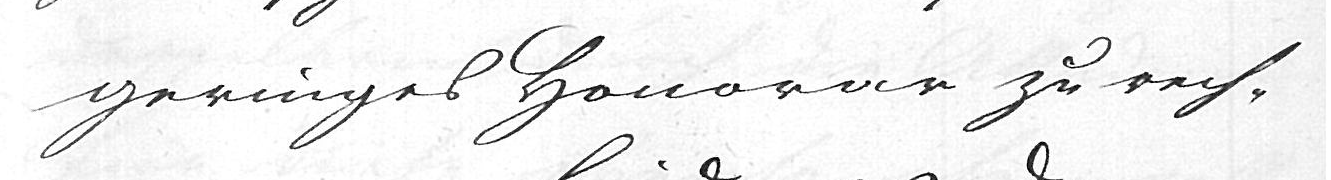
geringes Honorar zu rech-
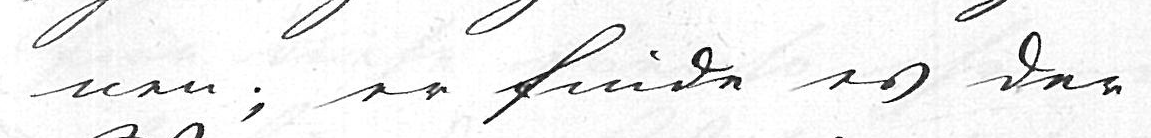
nen; er finde es der
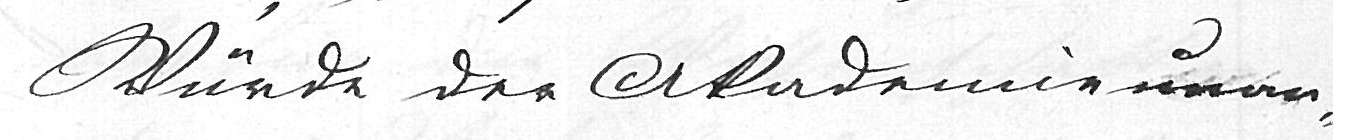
Würde der Akademien unan-
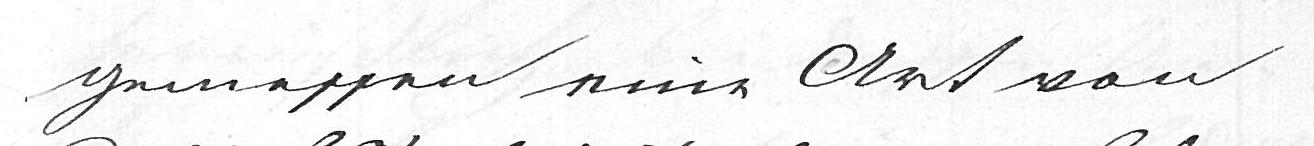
gemessen eine Art von
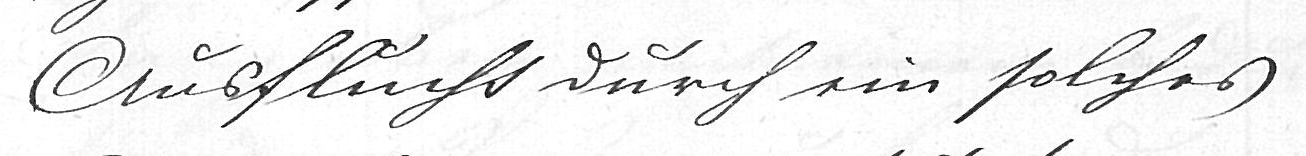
Ausflucht durch ein solches
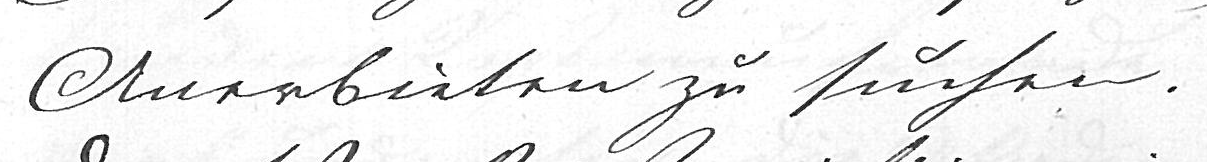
Anerbieten zu suchen.
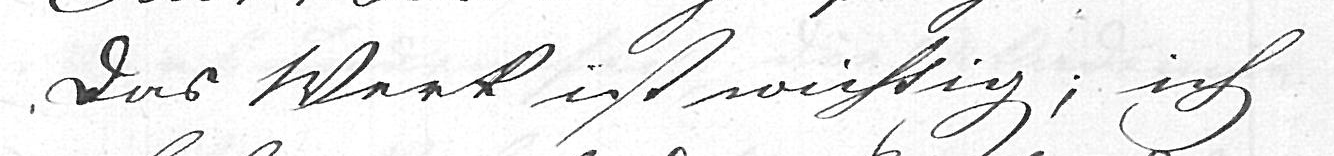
Das Werk ist wichtig; ich
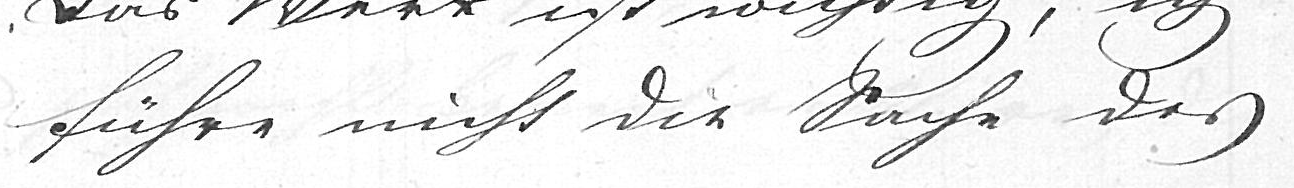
führe nicht die Sache des
